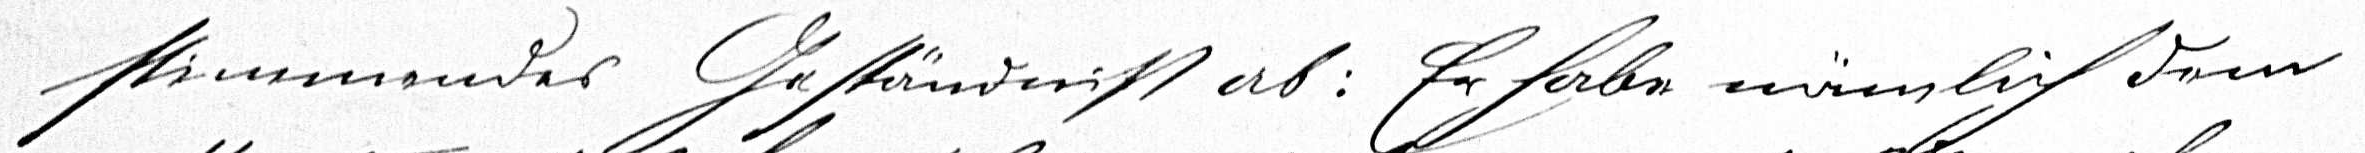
timmendes Geständniß ab: Er habe nämlich dem
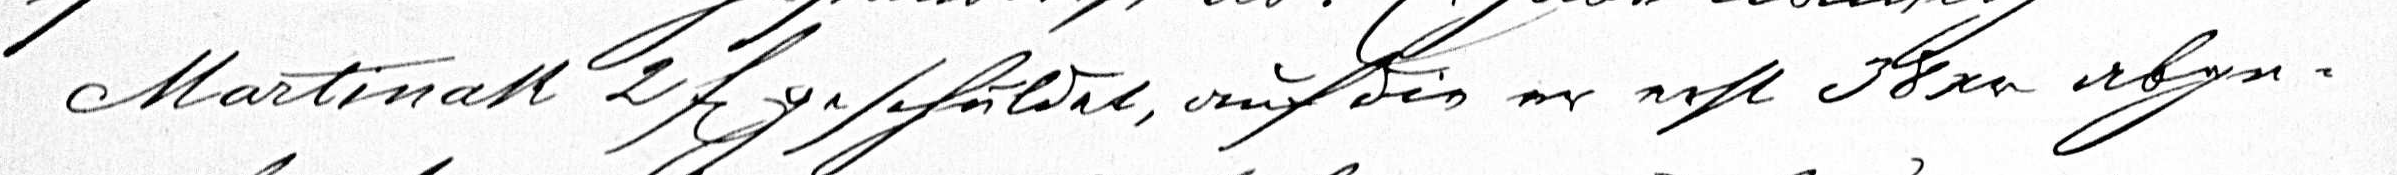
Martinak 2f geschuldet, auf die er erst 38kr abge¬
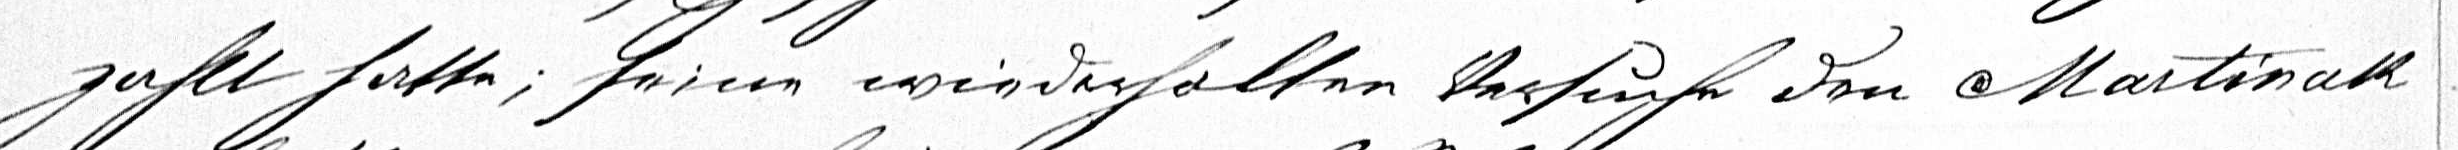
zahlt hatte; seine widerholten Versuche den Martinak
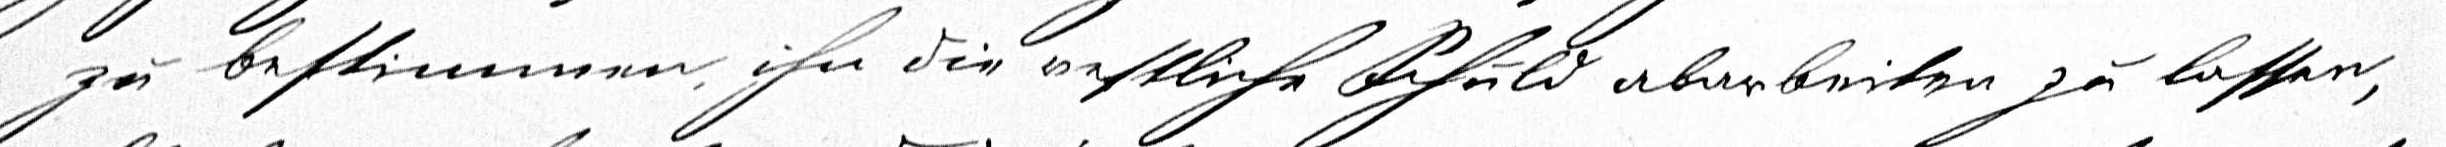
zu bestimmen, ihn die restliche Schuld abarbeiten zu lassen,
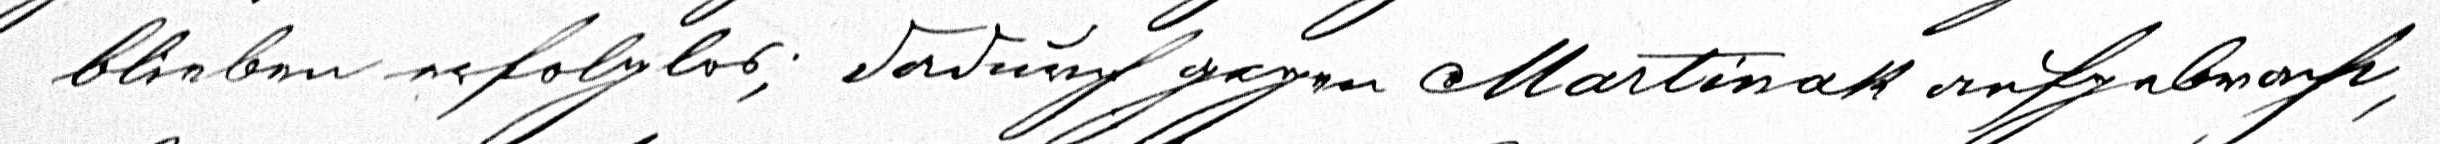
blieben erfolglos; dadurch gegen Martinak aufgebracht,
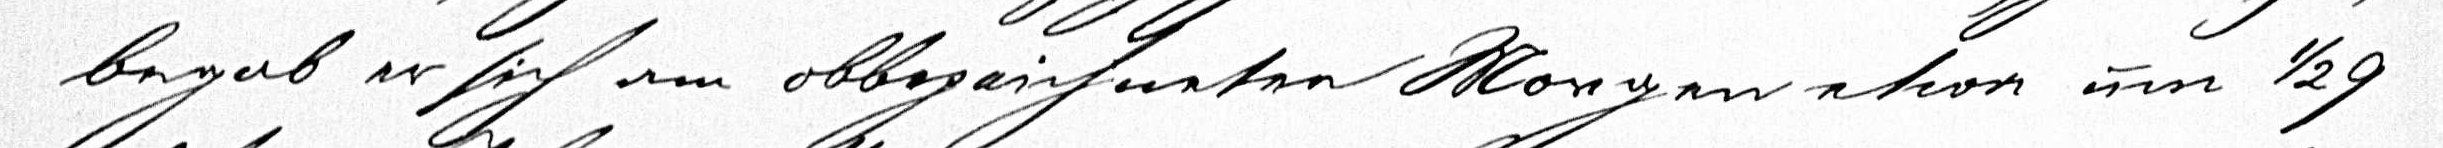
begab er sich am obbezeichneten Morgen etwa um ½ 9
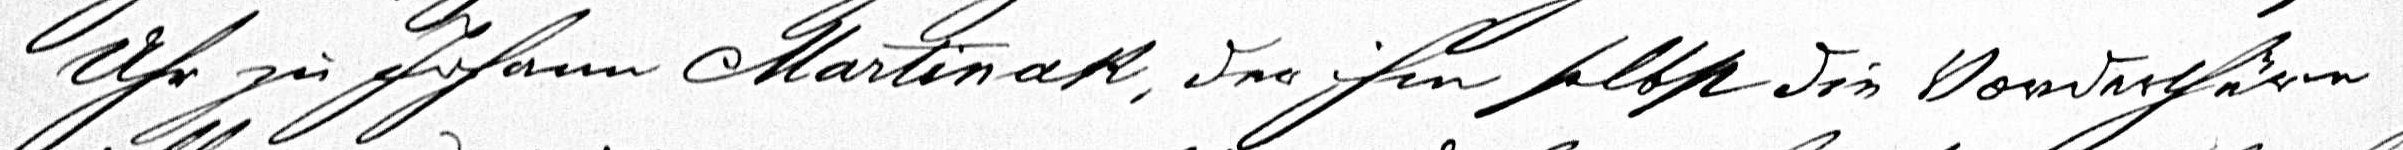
Uhr zu Johann Martinak, der ihm selbst die Vorderthüren
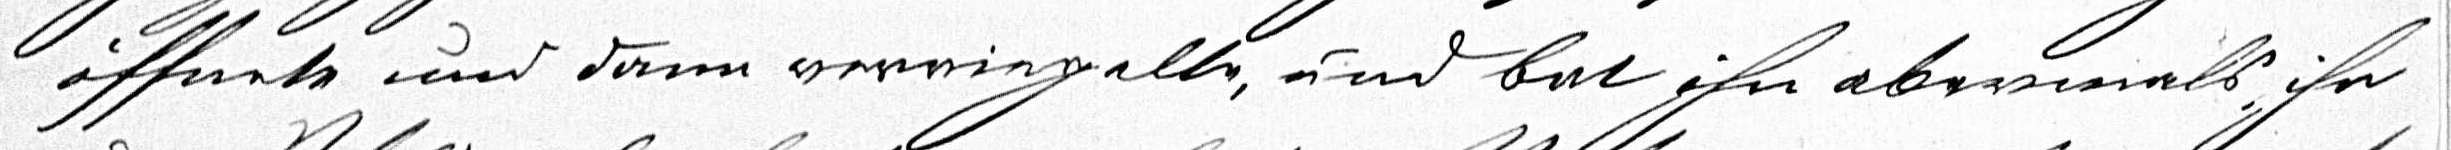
öffnete und dann verriegelte, und bat ihn abermals, ihn
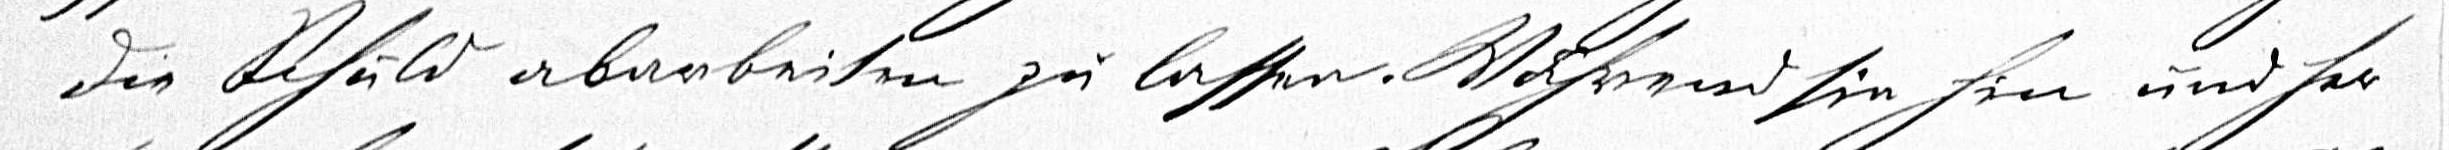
die Schuld abarbeiten zu lassen. Während sie hin und her
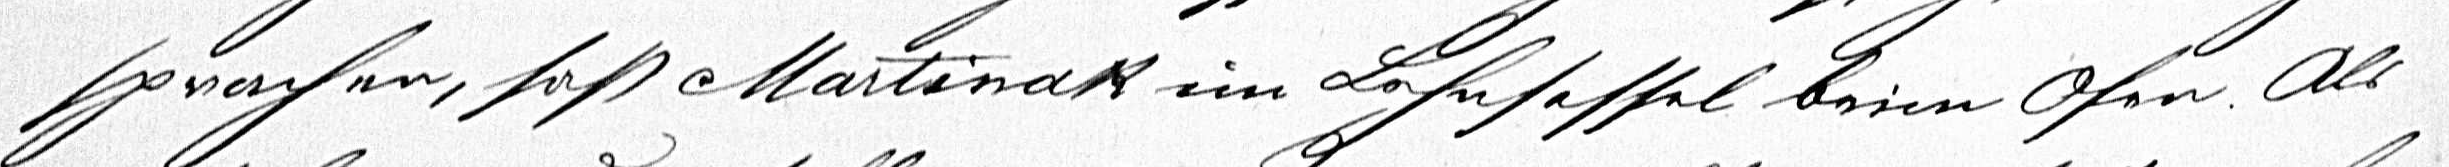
sprachen, saß Martinak im Lehnsessel beim Ofen. Als
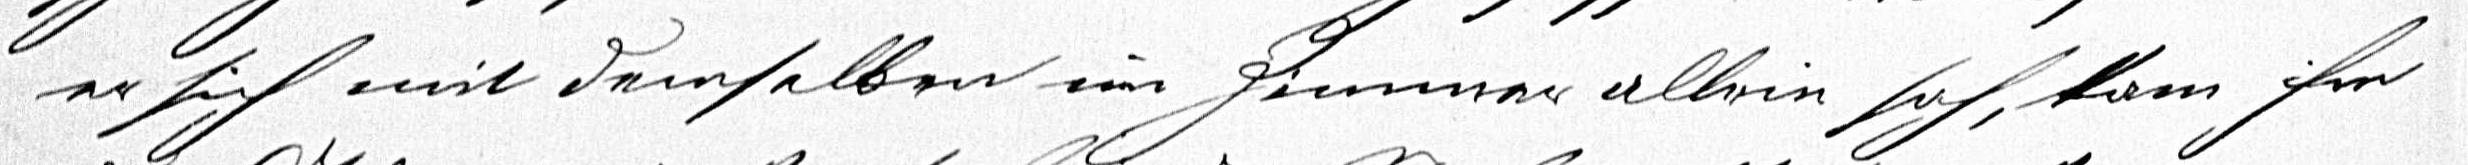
er sich mit demselben im Zimmer allein sah, kam ihm
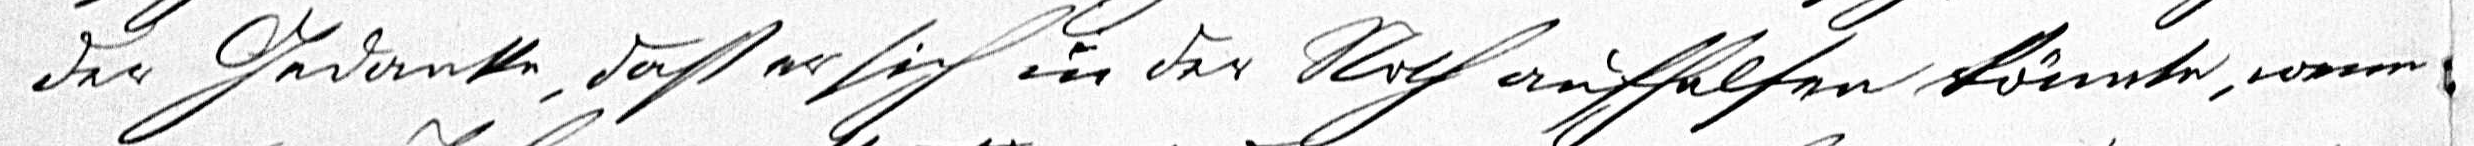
der Gedanke, daß er sich in der Noth aufhelfen könnte, wenn
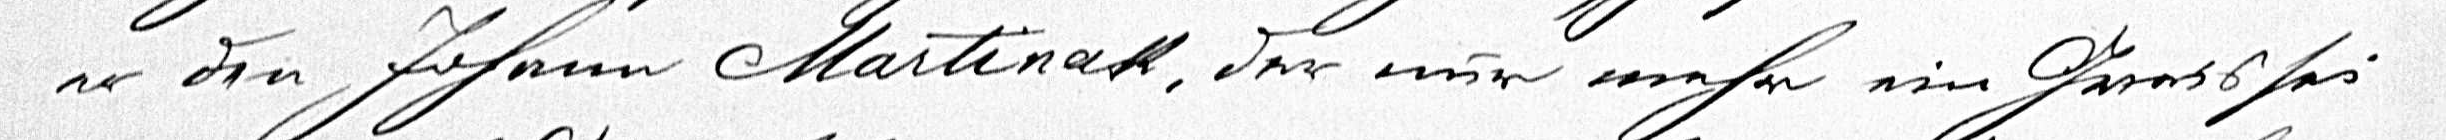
er den Johann Martinak, der nur mehr ein Greis sei
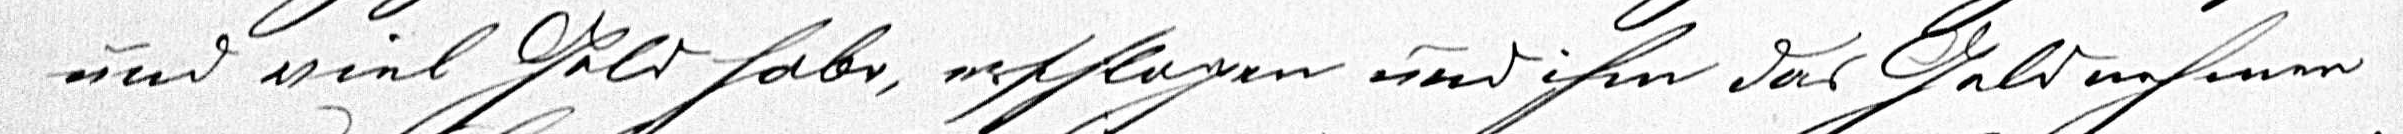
und viel Geld habe, erschlagen und ihm das Geld nehmen
